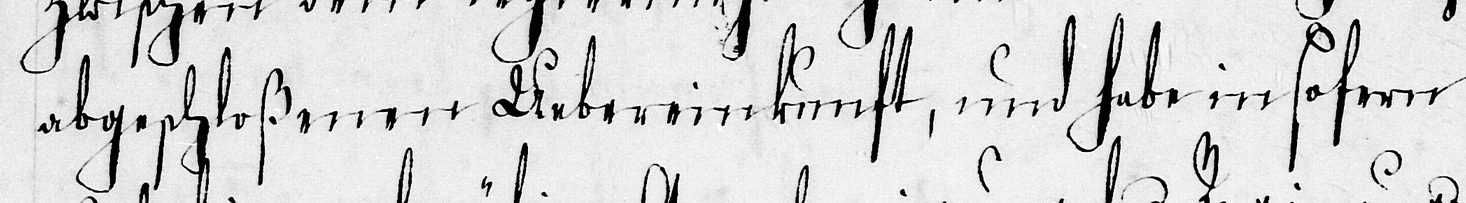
abgeschloßenen Uebereinkunft, und habe in sofern
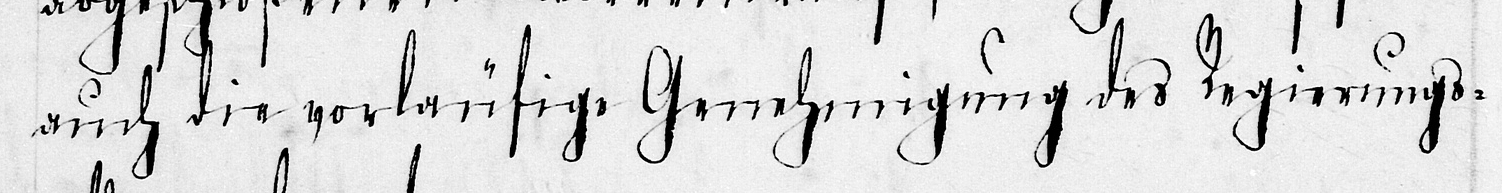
auch die vorläufige Genehmigung des Regierungs¬
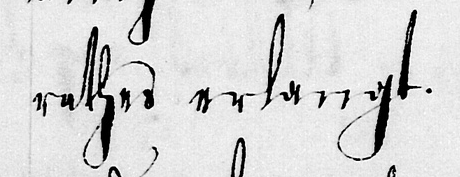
rathes verlangt.
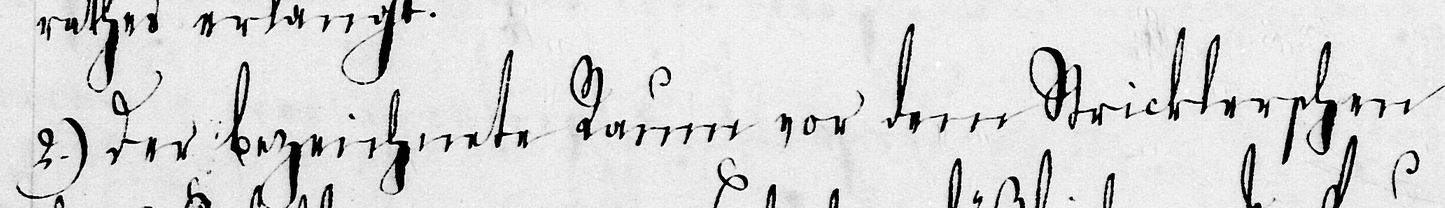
2.) Der bezeichnete Raum vor dem Stricklerschen
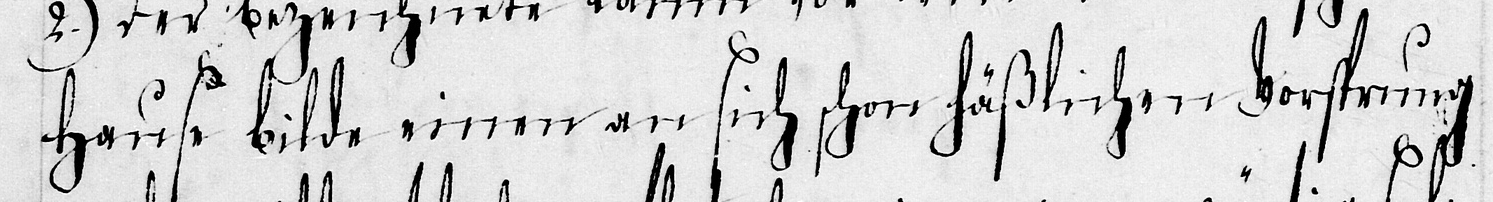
Hause bilde einen an sich schon häßlichen Vorsprung
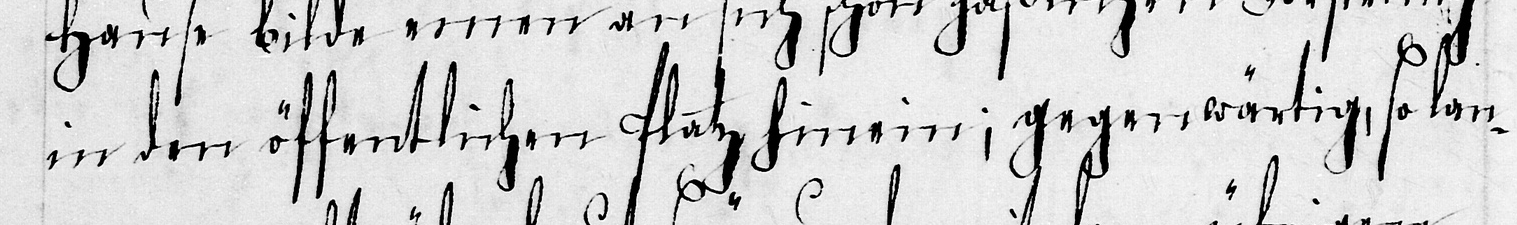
in den öffentlichen Platz hinein; gegenwärtig, so l¬
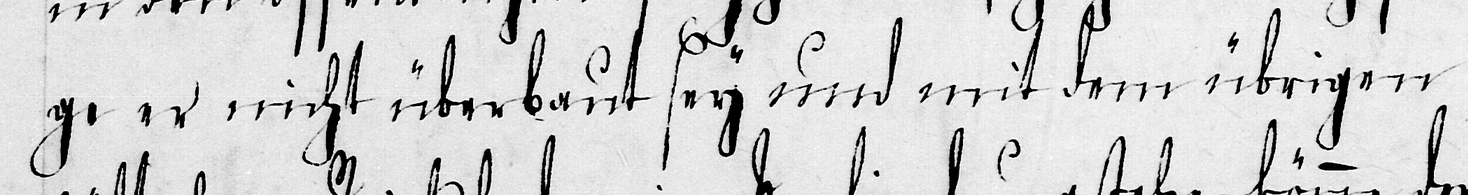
ge er nicht überbaut sey und mit dem übrigen
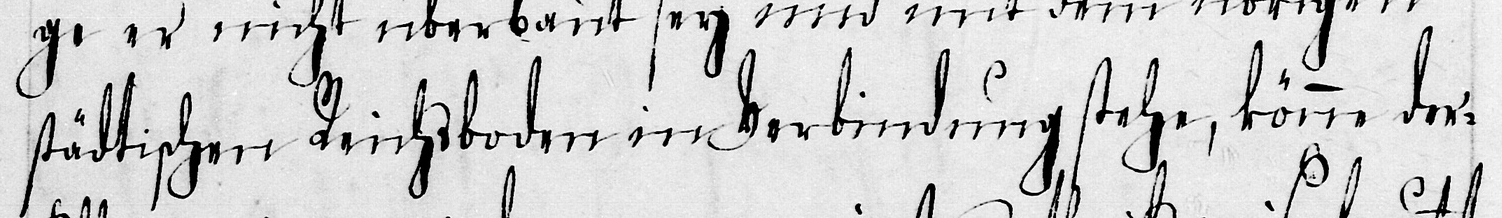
städtischen Reichsboden in Verbindung stehe, könne der¬
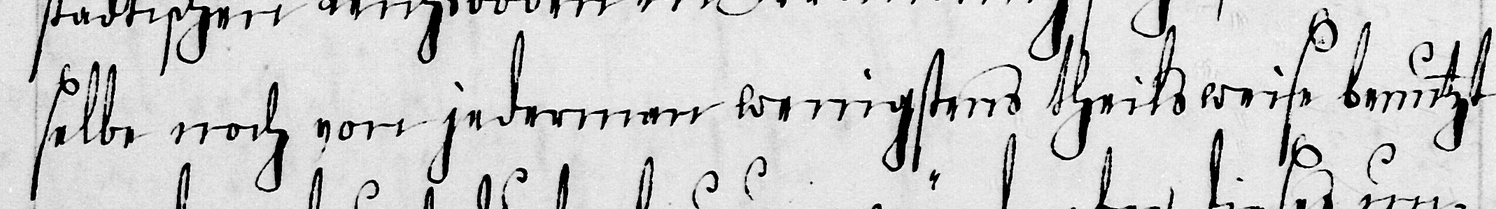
selben noch von jederman wenigstens theilweise benutzt
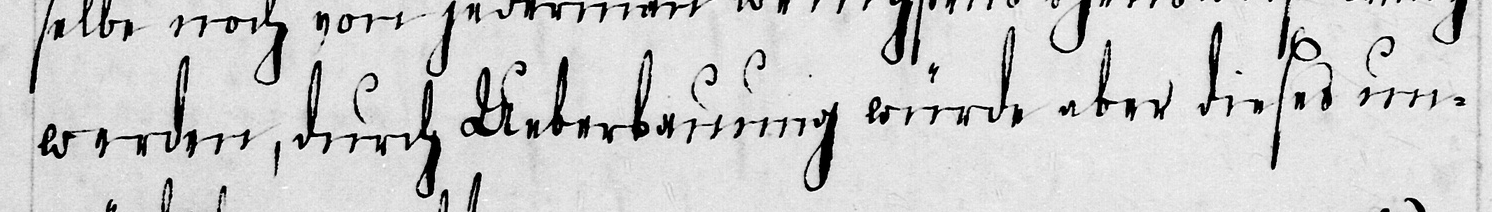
werden, durch Ueberbauung würde aber diese un¬
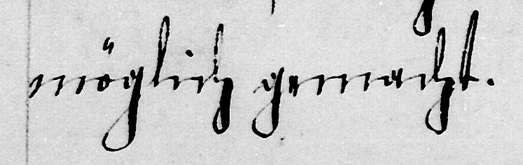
möglich gemacht.
